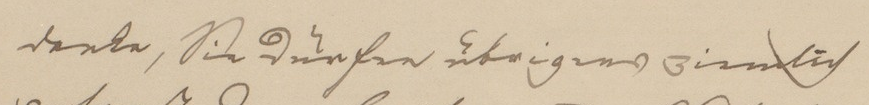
denke, Sie dürfen übrigens ziemlich
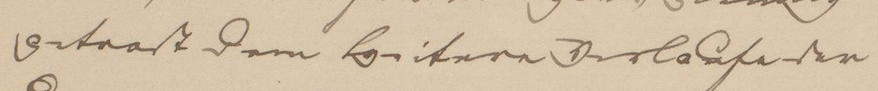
getrost dem weitern Verlaufe der
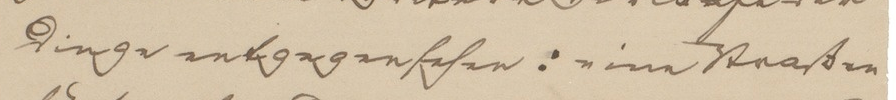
Dinge entgegensehen: eine Straßen-
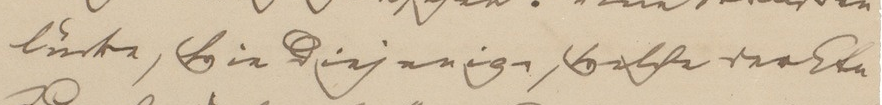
lücke, wie diejenige, welche der Ctn
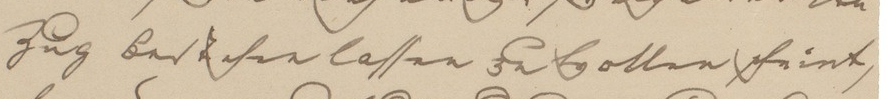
Zug bestehen lassen zu wollen scheint,
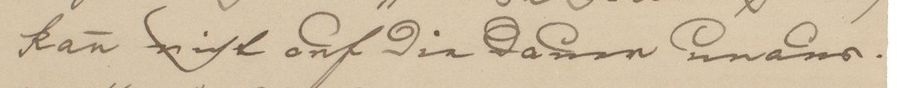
kann nicht auf die Dauer unaus-
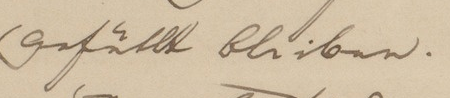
gefüllt bleiben.
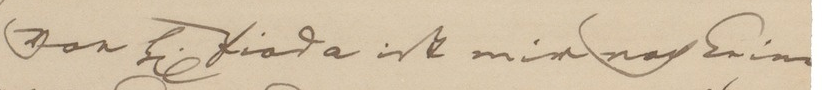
Von H. Pioda ist mir noch keine
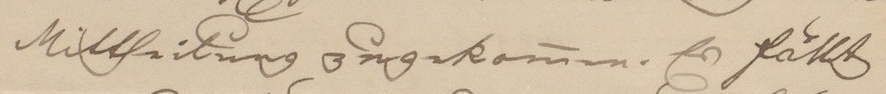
Mittheilung zugekommen. Es fällt
